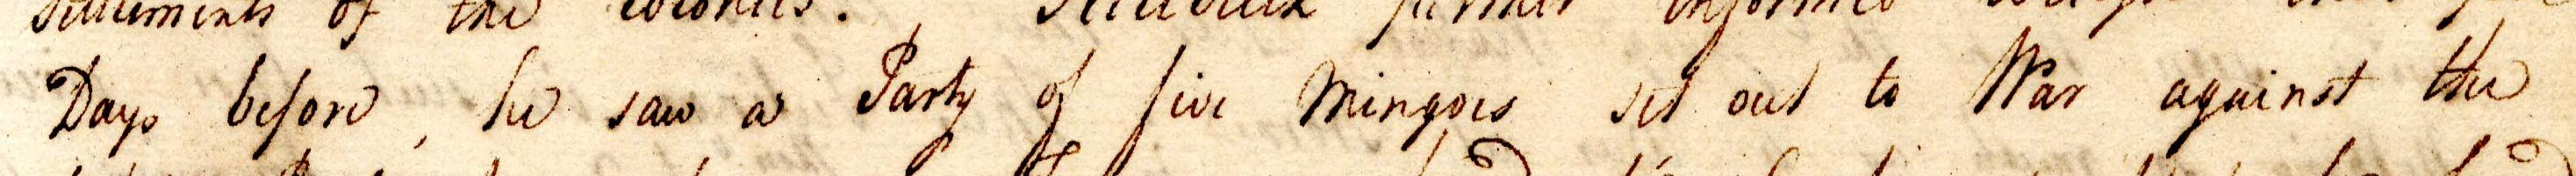Days before, he saw a Party of five mingoes set out to War against the
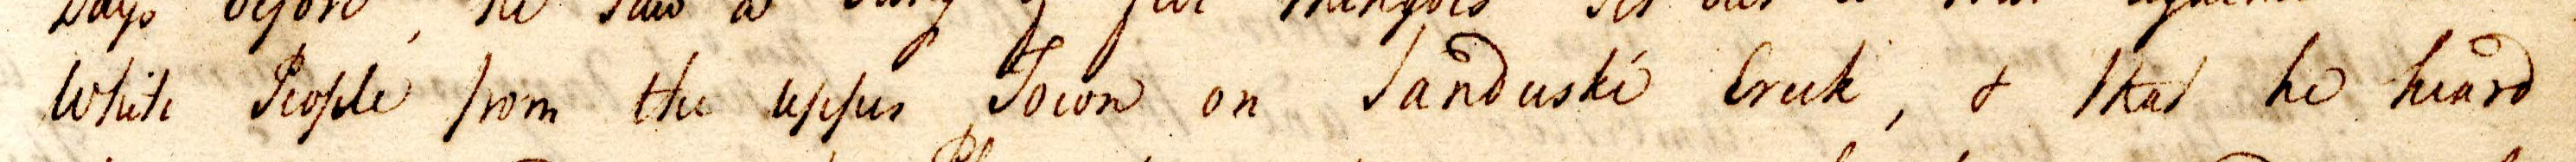White People from the upper Town on Sanduské Creek, & that he heard
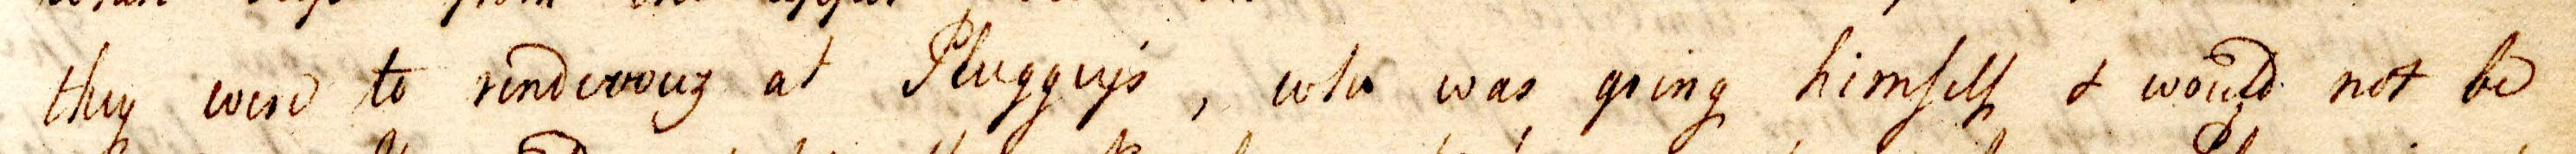they were to rendevouz at Pluggey's, who was going himself & would not be
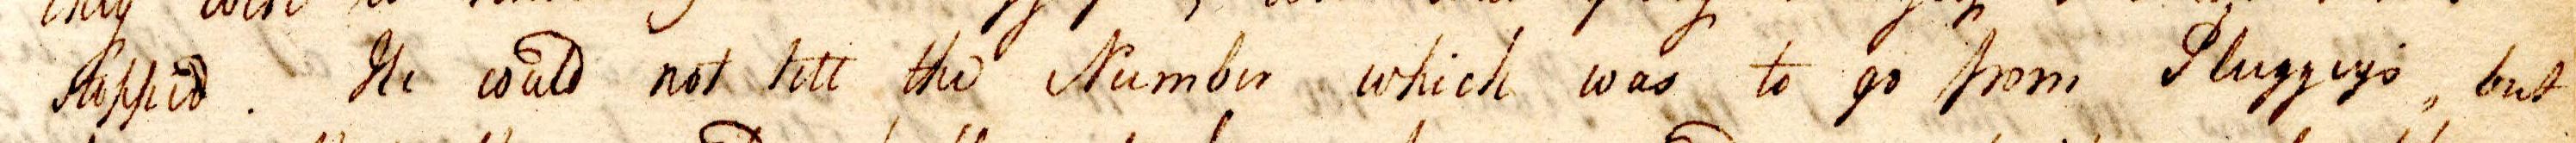stopped. He could not tell the Number which was to go from Pluggey's, but
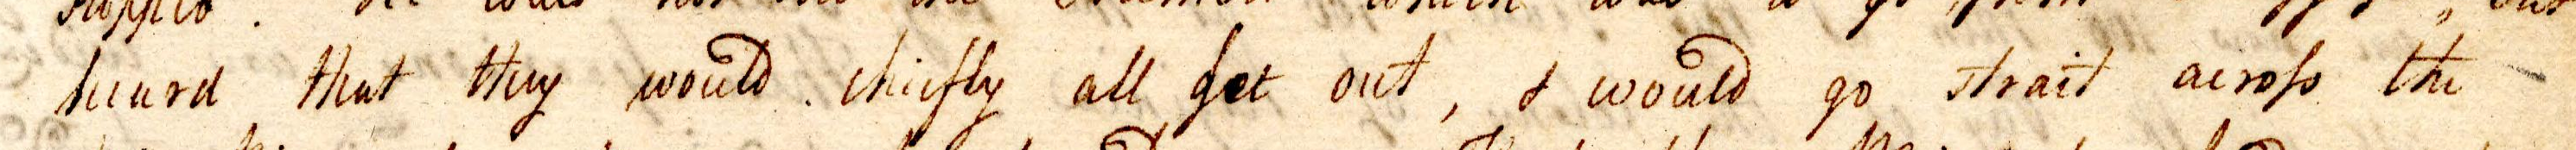heard that they would chiefly all get out, & would go strait across the
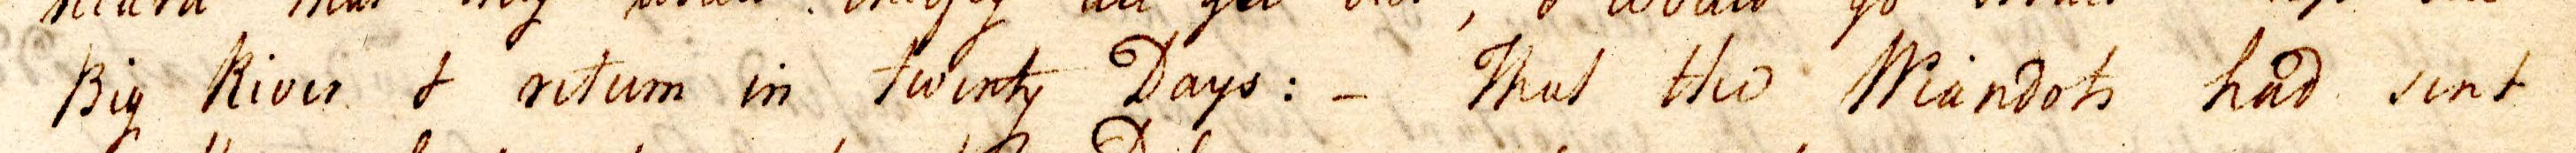Big River & return in twenty Days:- That the Wiandots had sent
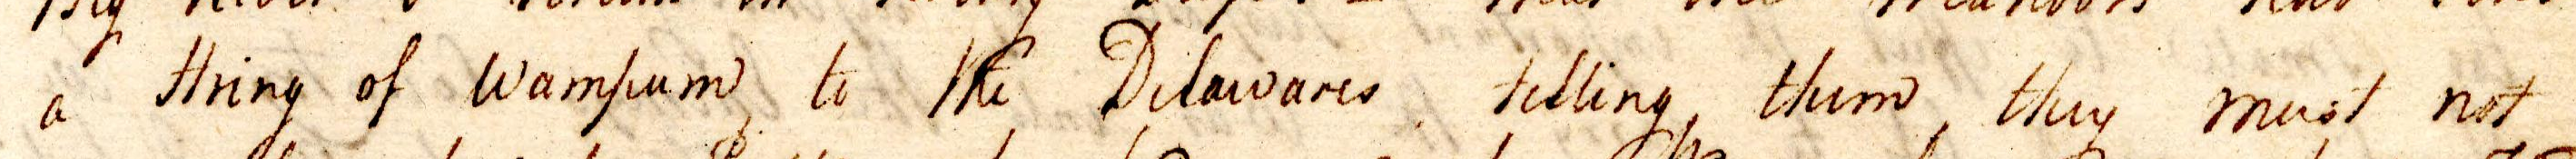a String of Wampum to the Delawares telling them they must not
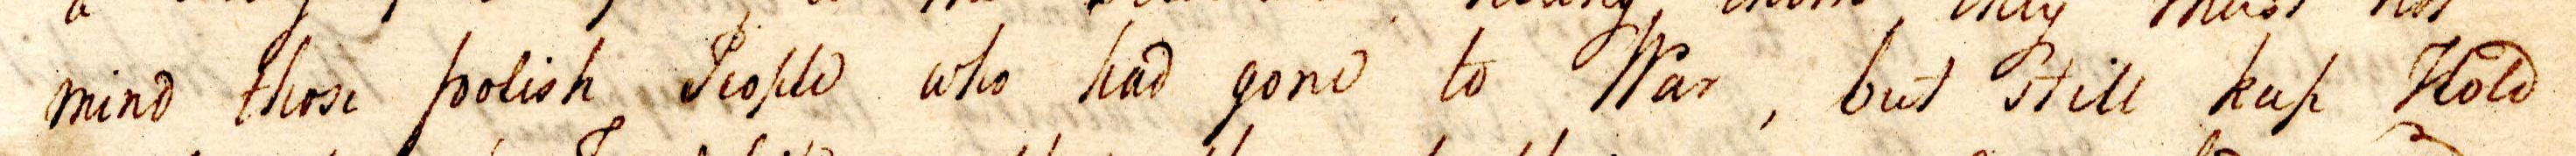mind those foolish People who had gone to War, but still keep Hold
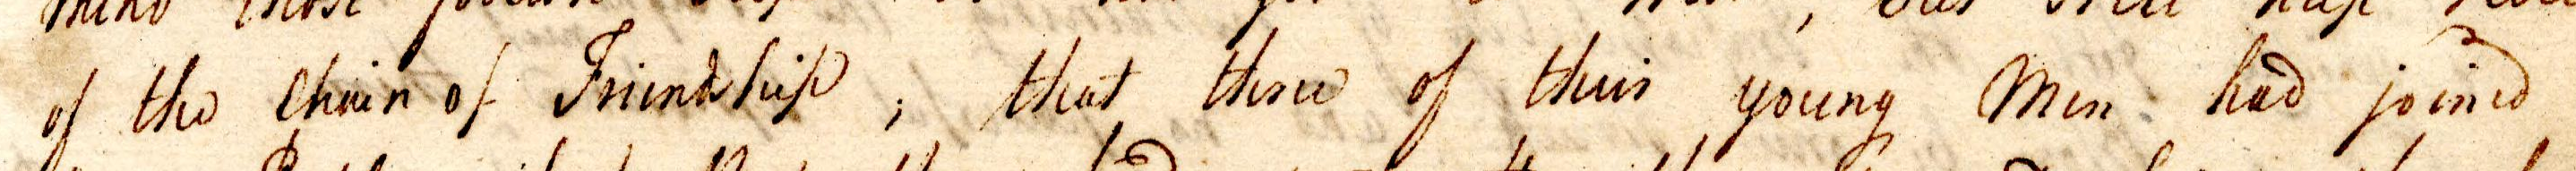of the chain of Friendship; that three of their young Men had joined
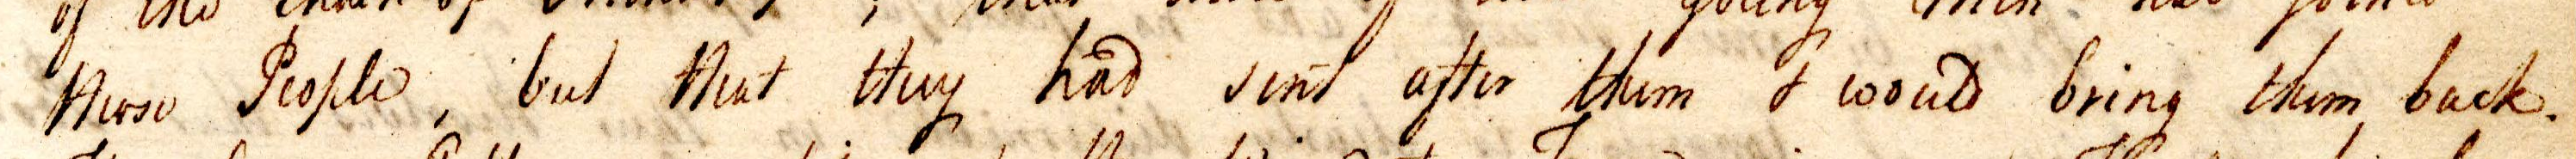those People, but that they had sent after them & would bring them back.
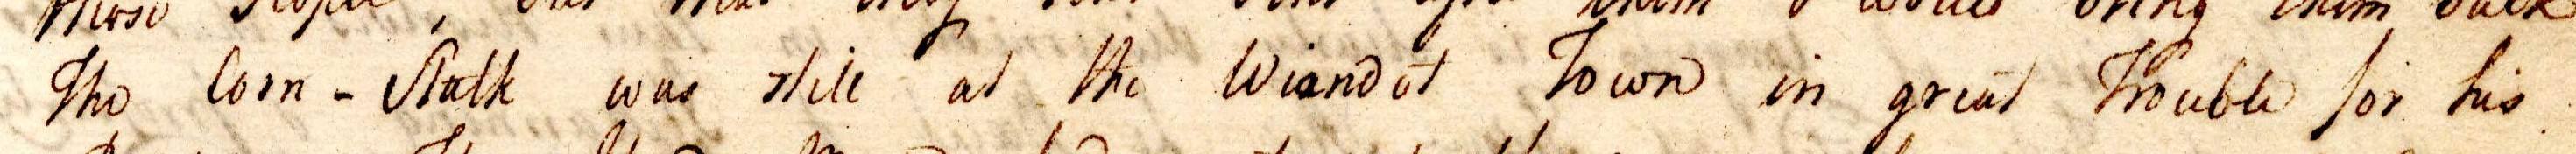The Corn-Stalk was still at the Wiandot Town in great Trouble for his
